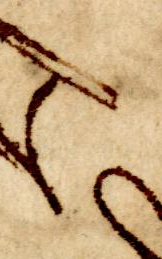4
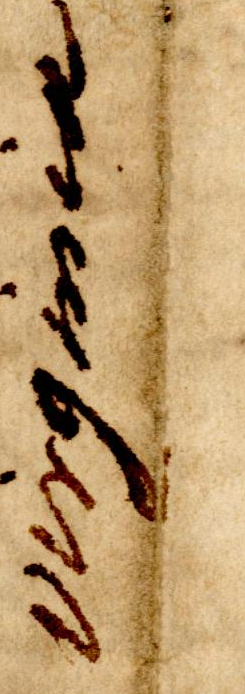Virginia
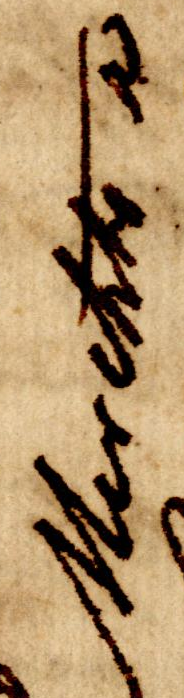Merch^t
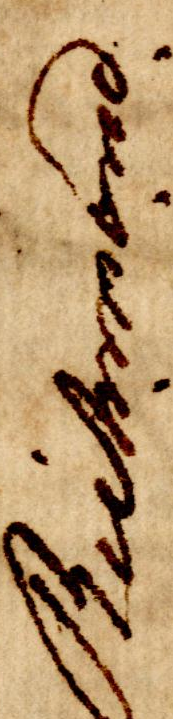Richmond
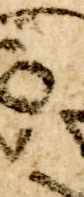26
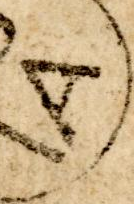Ja
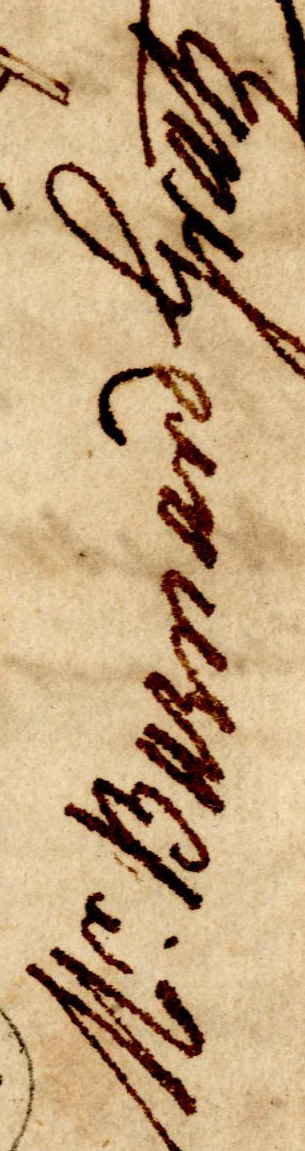M^r Barnard Gratz
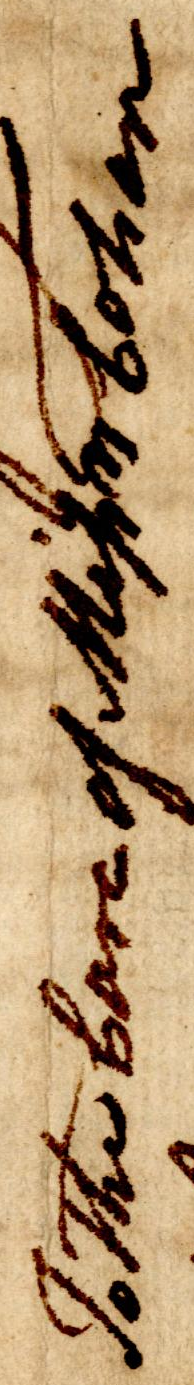to the Care of Mess^rs Cohan
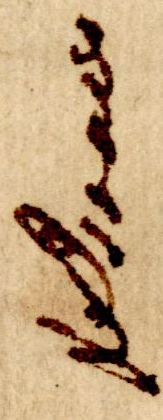& Simon
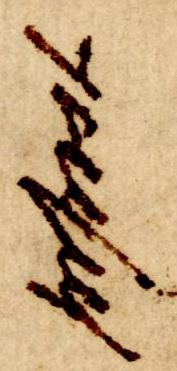per post
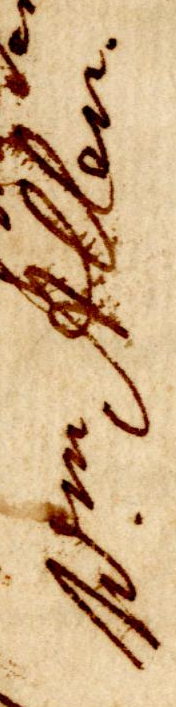W^m Allen
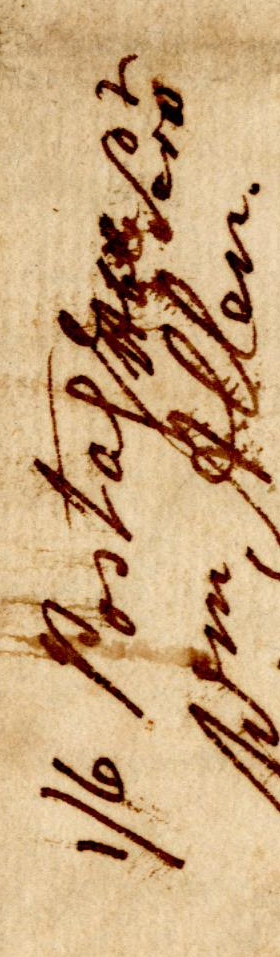1/6 Postage Able Serv^t
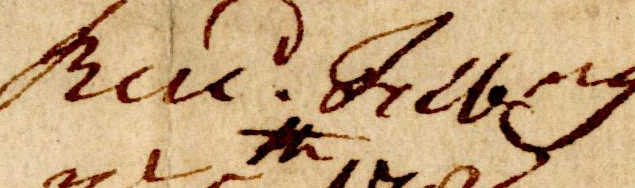rece^d Febr^y
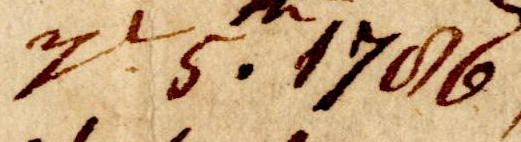Y^ 5^th 1786
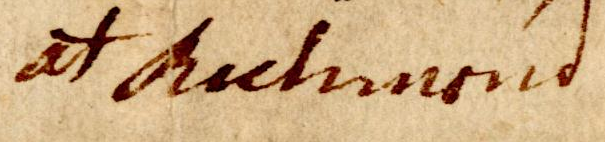at Richmond
